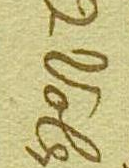2 Vols
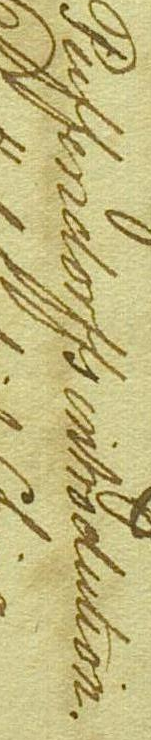Puffendorffs introduction.
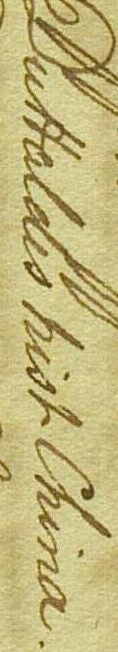DuHaldes hist China
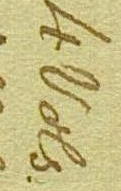4 Vols.
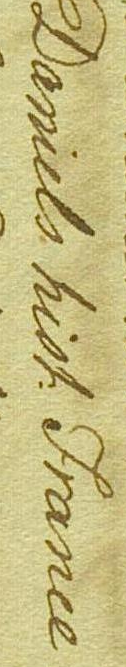Daniels hist. France
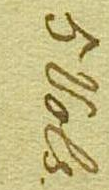5 Vols.
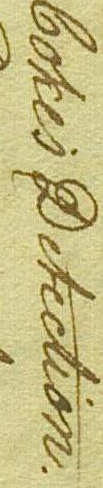Coke's Detection.
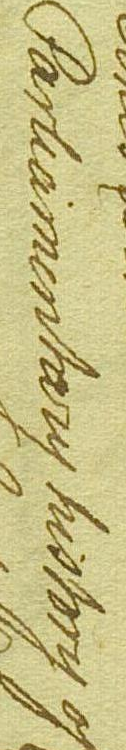Parliamentary history of
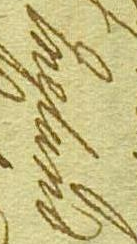England
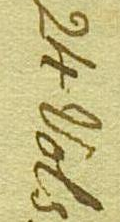24 Vols.
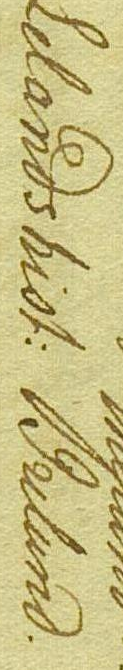Lelands hist: Ireland.
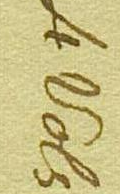4 Vols
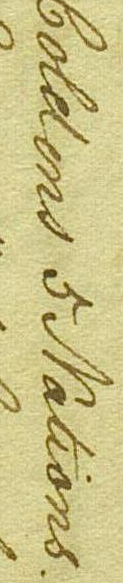Coldens 5 Nations.
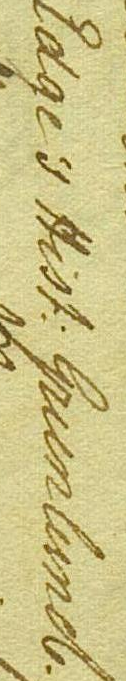Edge's Hist. Greenland.
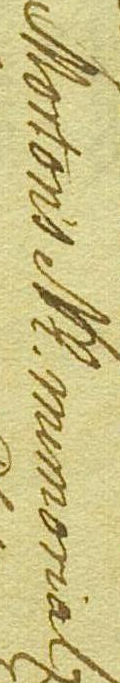Morton's N^o. memorial
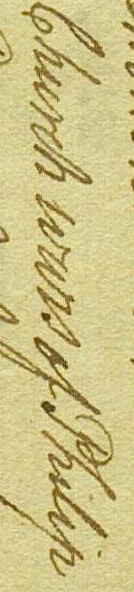Church wars of Philip
